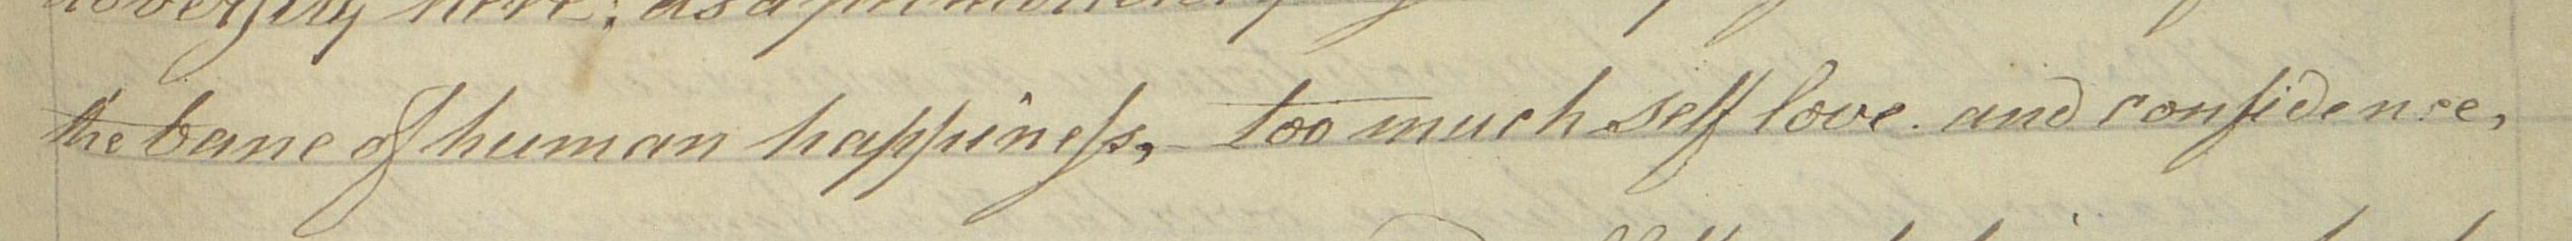the bane of human happiness, too much self love and confidence,
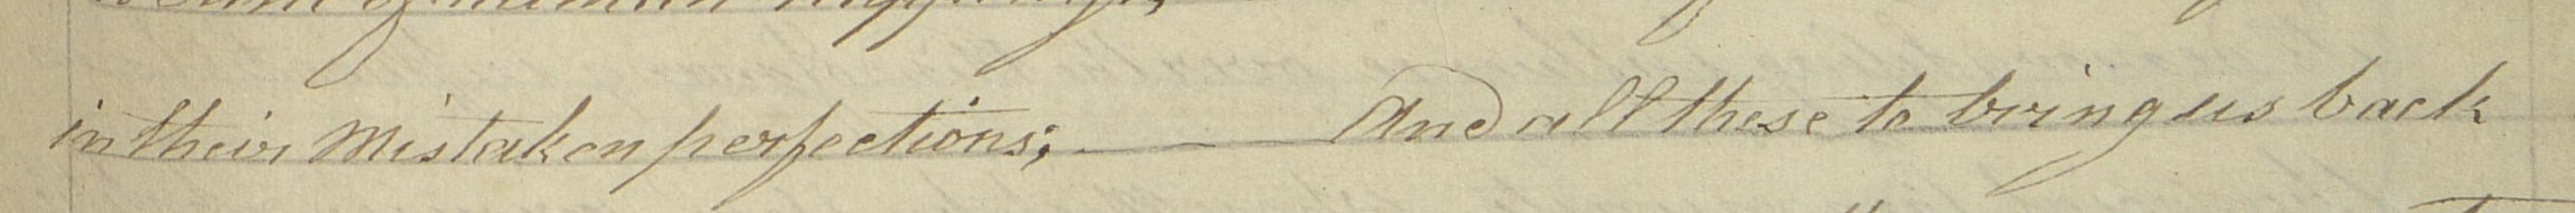in their Mistaken perfections; And all these to bring us back
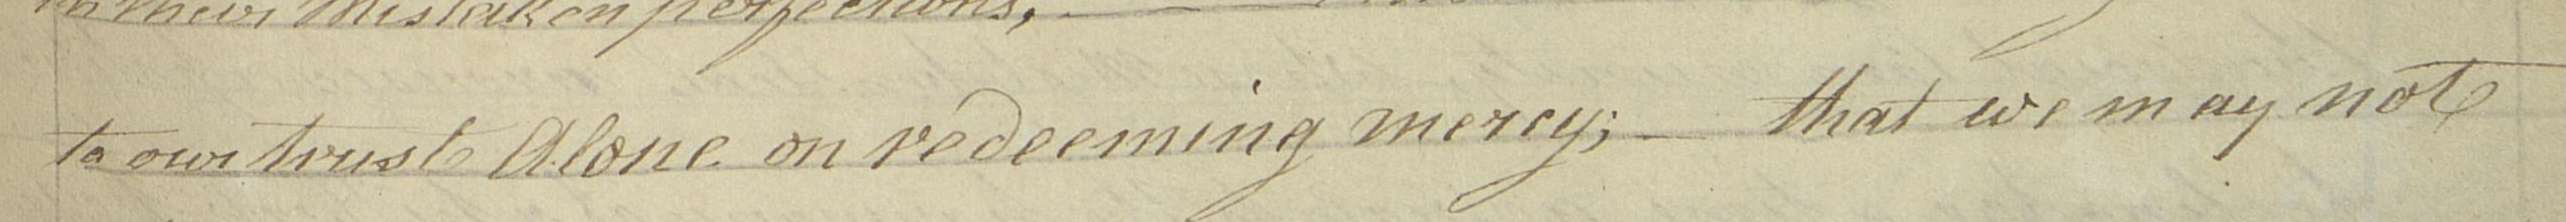to our trust Alone on redeeming mercy; that we may not
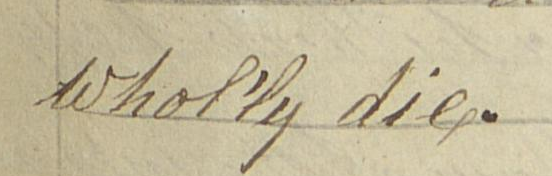Wholly die.
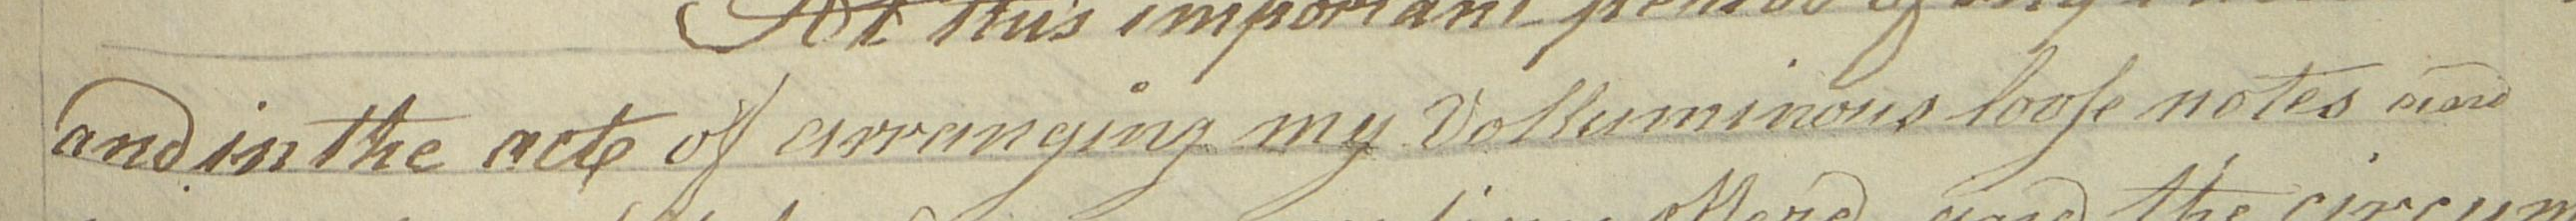and in the act of arranging my Volluminous loose notes and
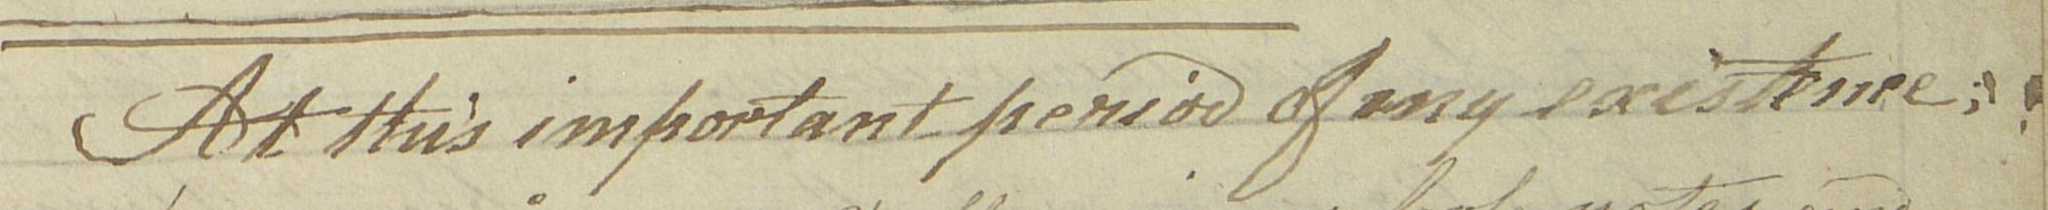At this important period of my existence;
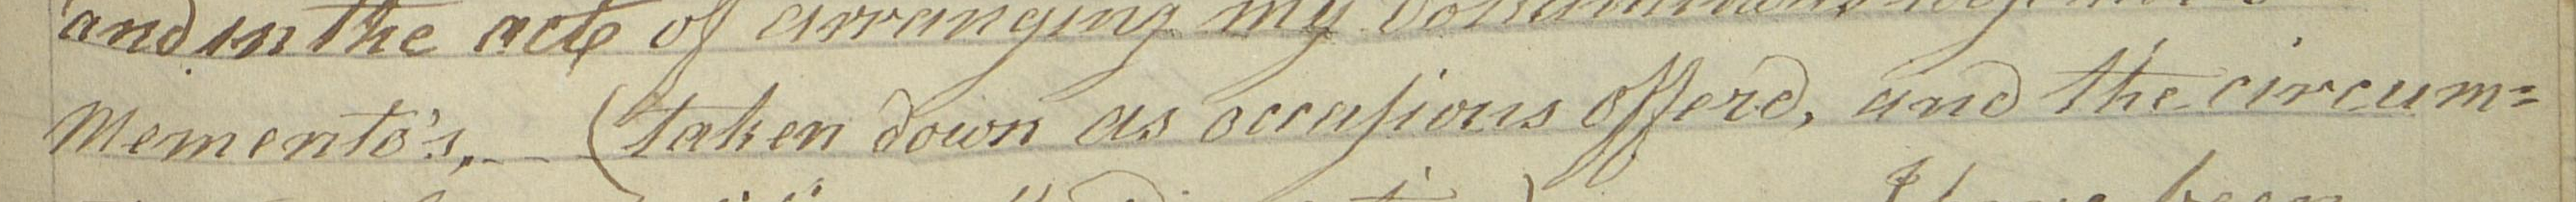Memento's, (taken down as occasions offer'd, and the circum-
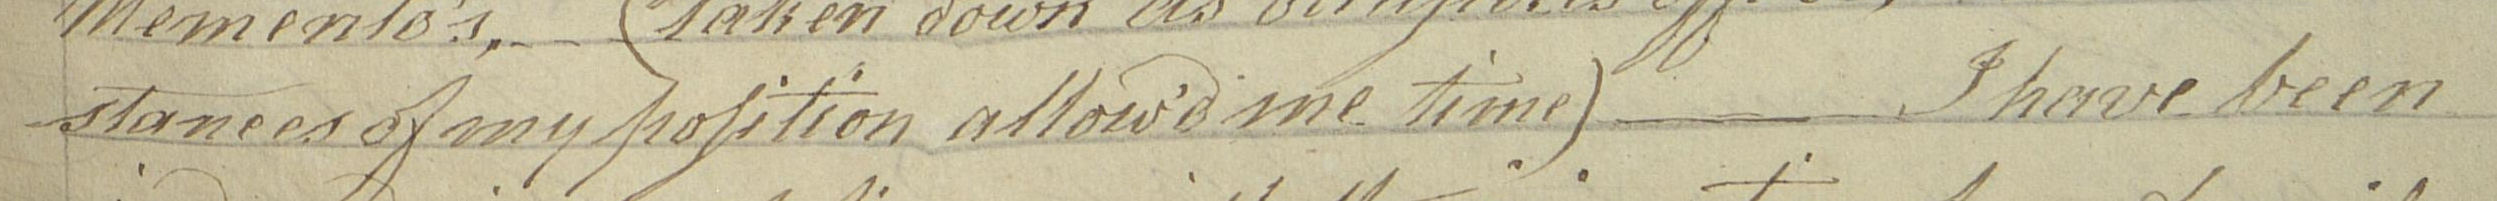stances of my position allow'd me time) I have been
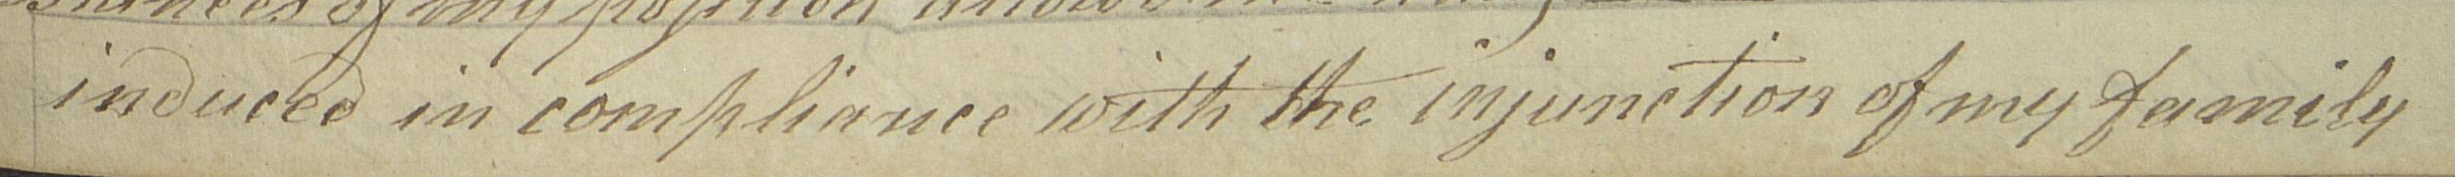induced in compliance with the injunction of my family
